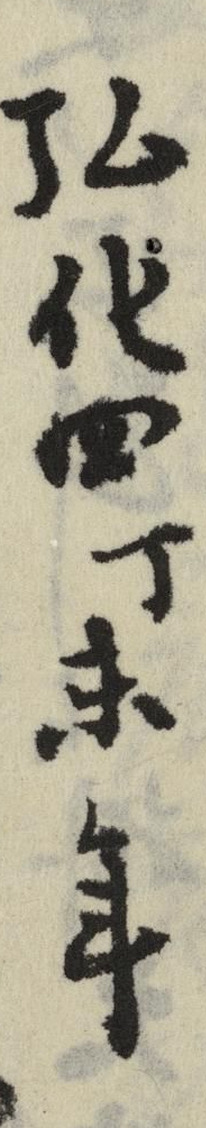弘化四丁未年
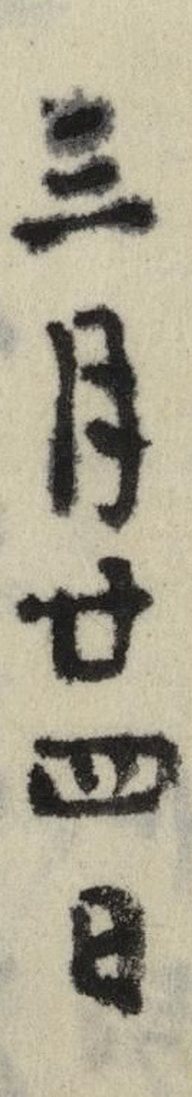三月廿四日
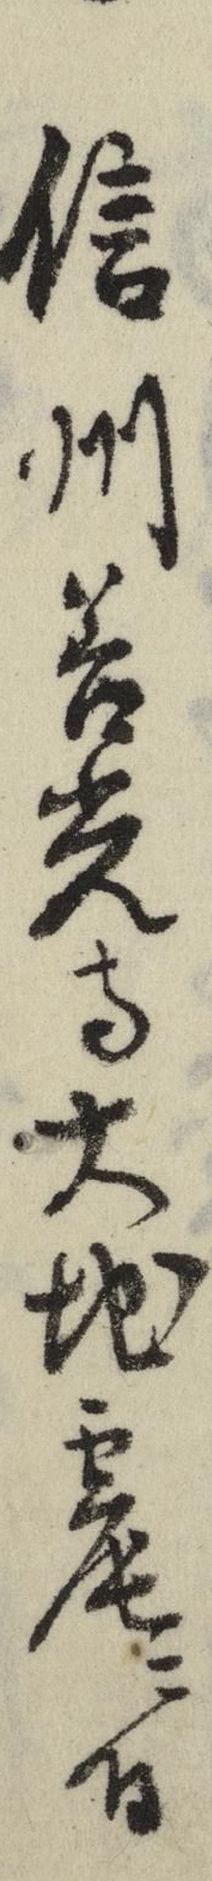一信州善光寺大地震ニ付
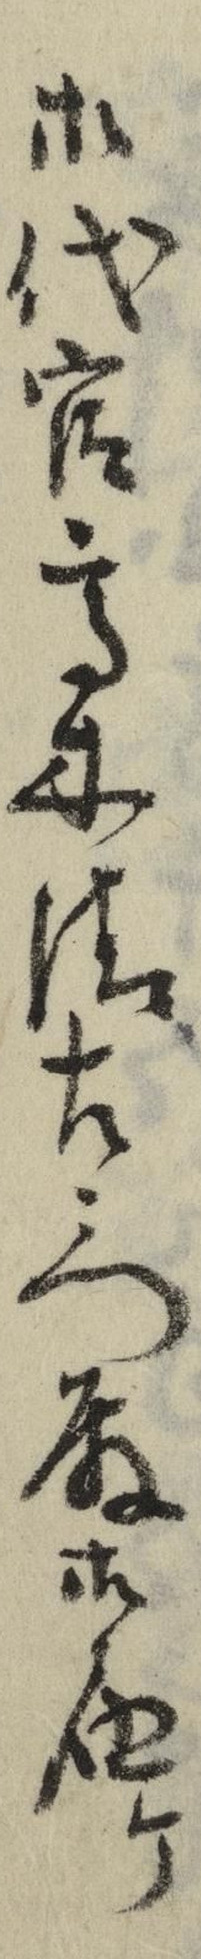御代官高木清左衛門殿御届ケ
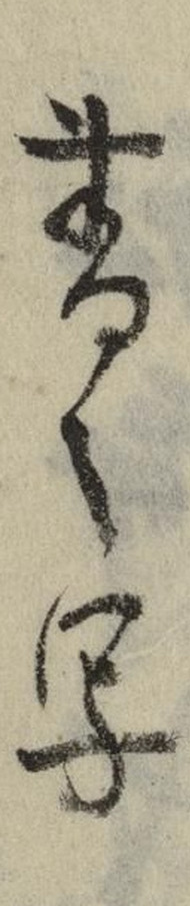書之写
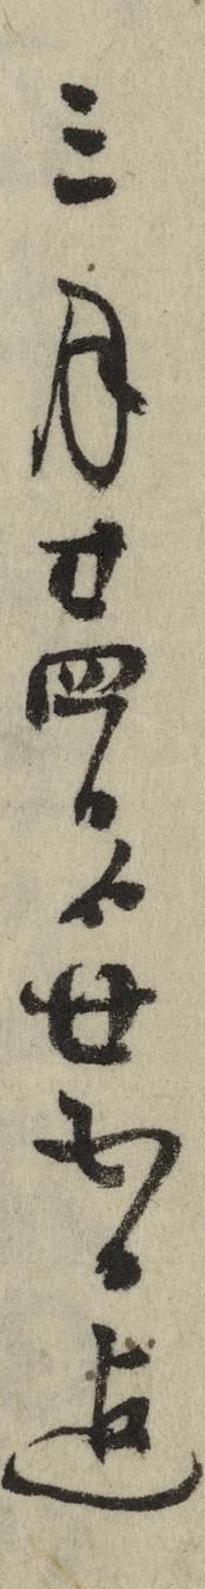三月廿四日ゟ廿五日迄
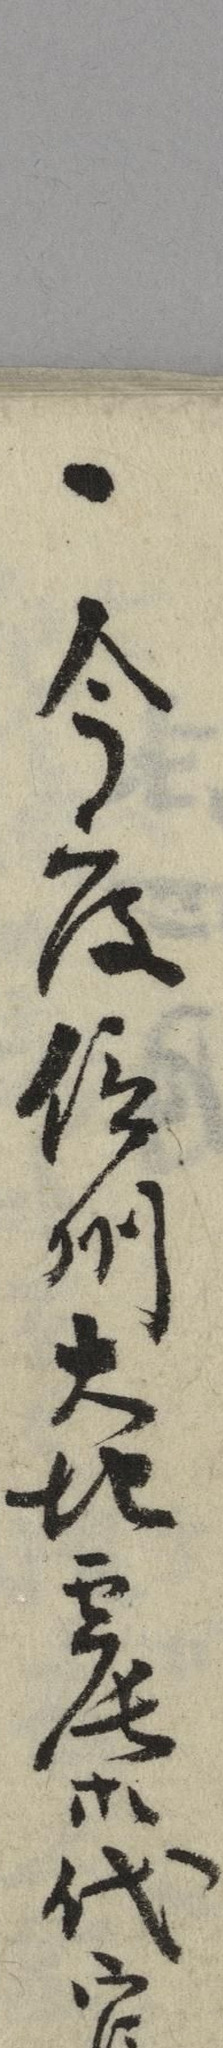一今度信州大地震御代官
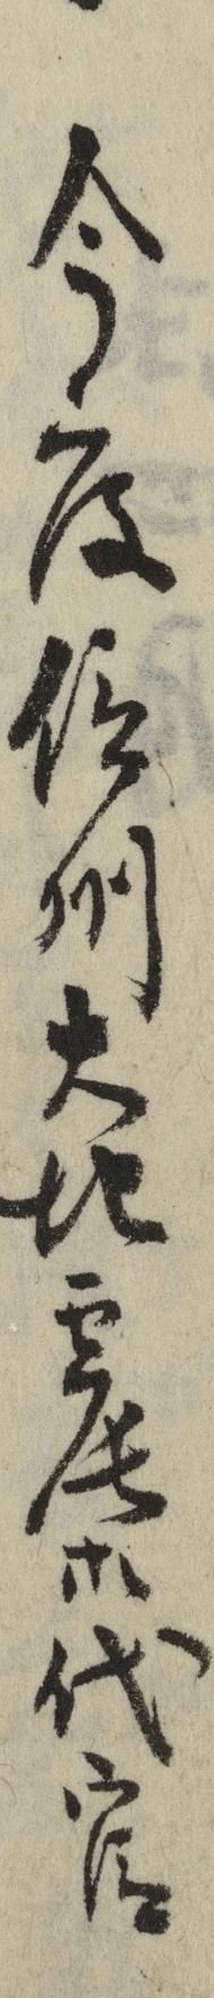一今度信州大地震御代官
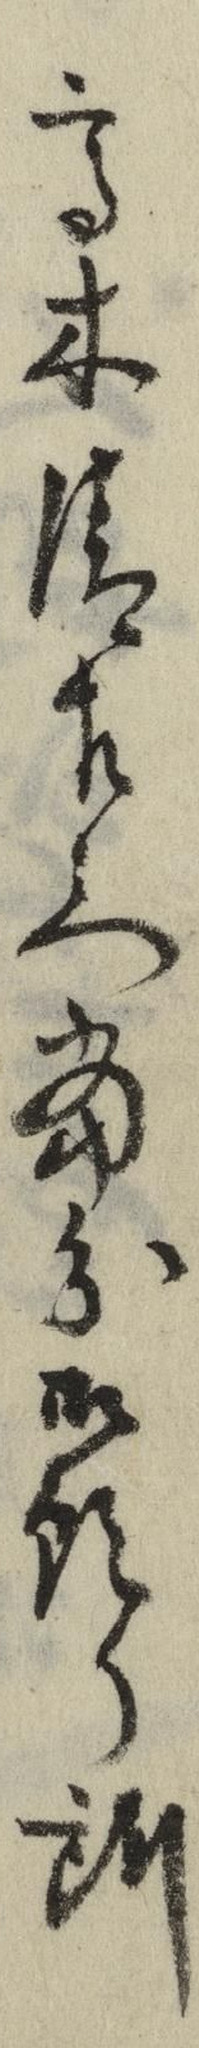高木清左衛門当分御預り所
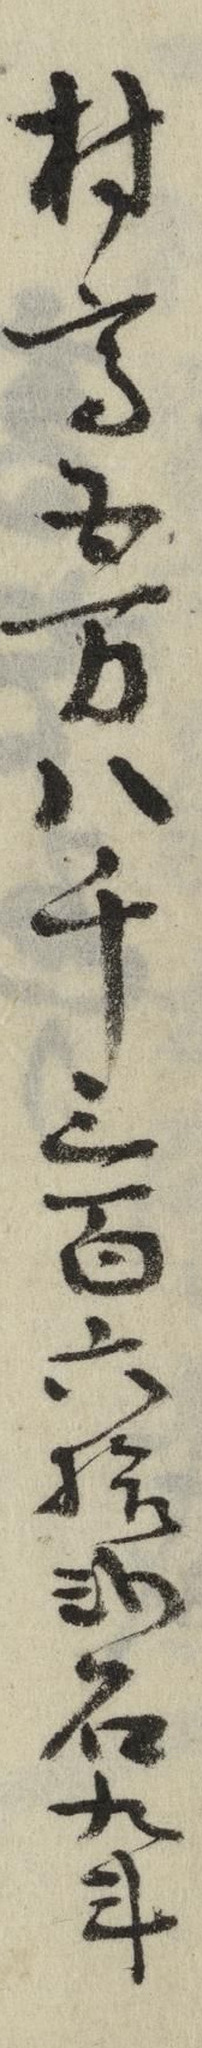村高五万八千三百六拾弐石九斗
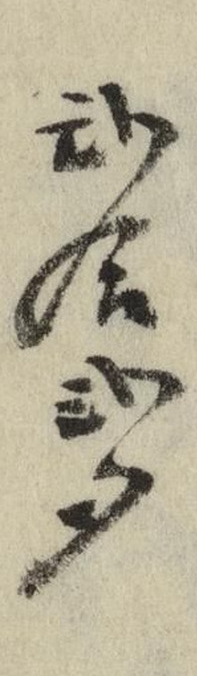弐合弐勺
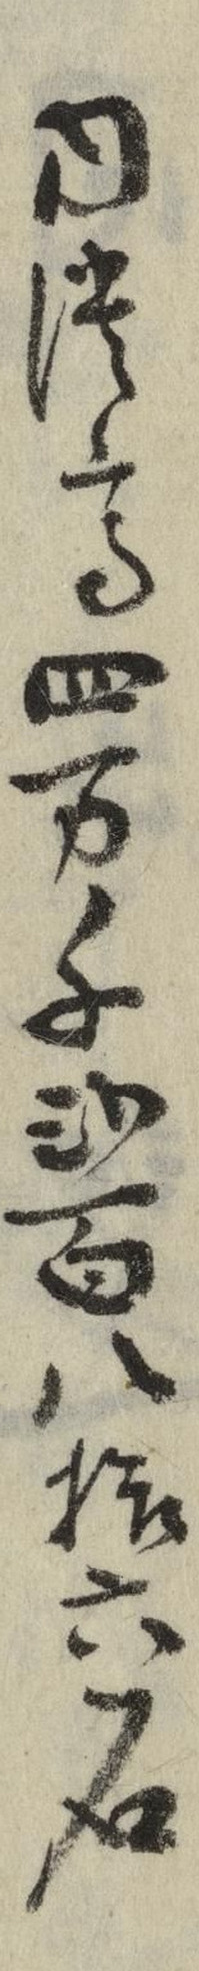内潰高四万千弐百八拾六石
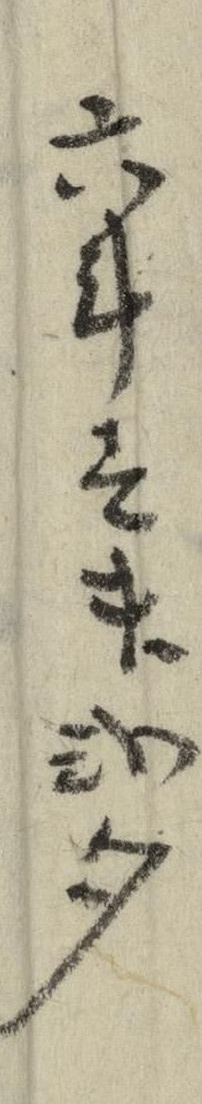六斗壱升弐勺
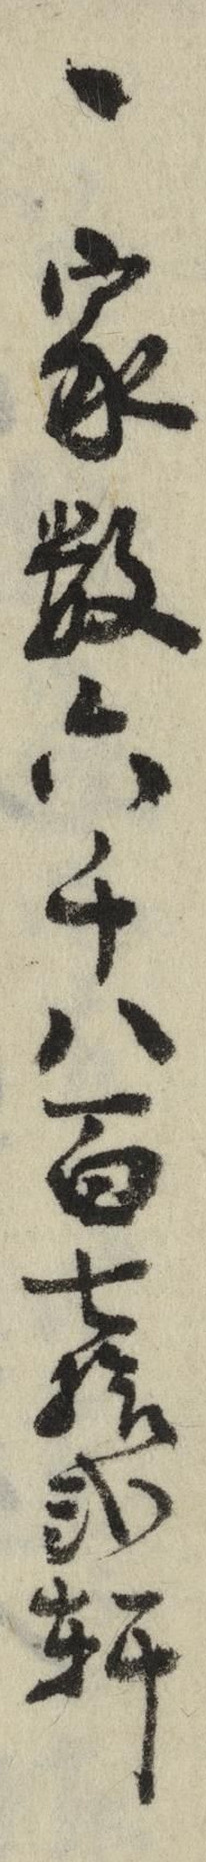一家数六千八百七拾弐軒
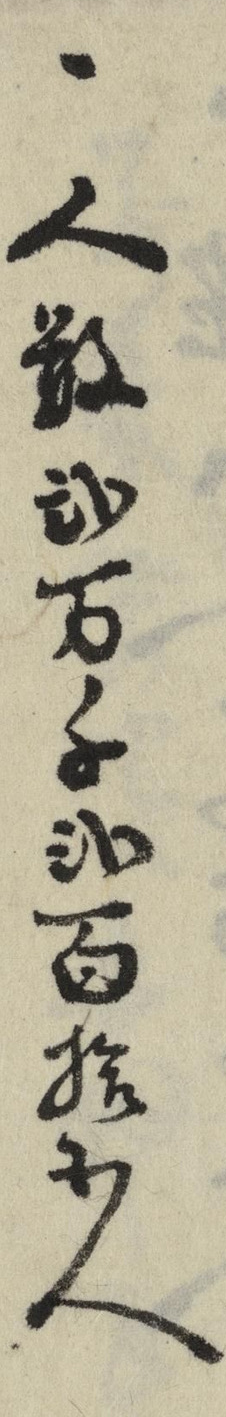一人数弐万千弐百拾五人
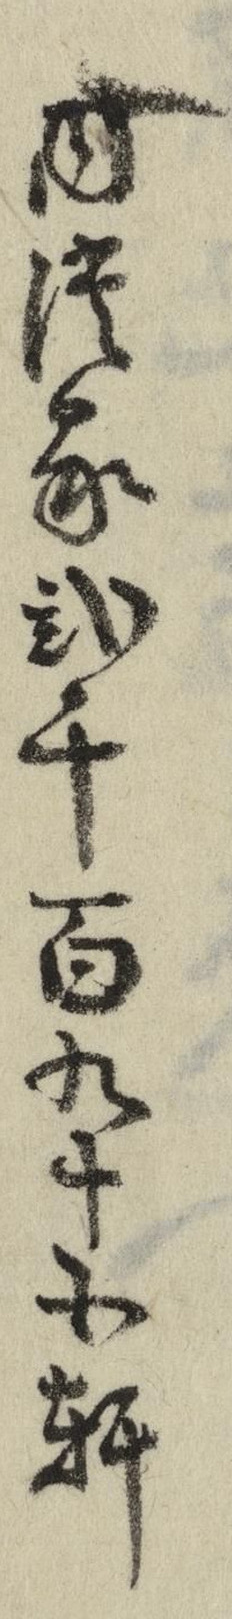内潰家弐千百九十五軒
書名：信州大地震一件之冩　丁未弘化四年三月吉日
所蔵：東京大学地震研究所図書室 Earthquake Research Institute Library, The University of Tokyo, JAPAN
